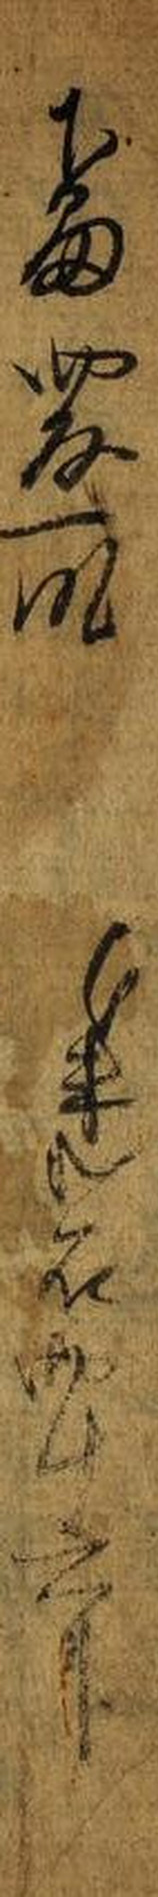下畠四反一畝分米四石弐斗六升
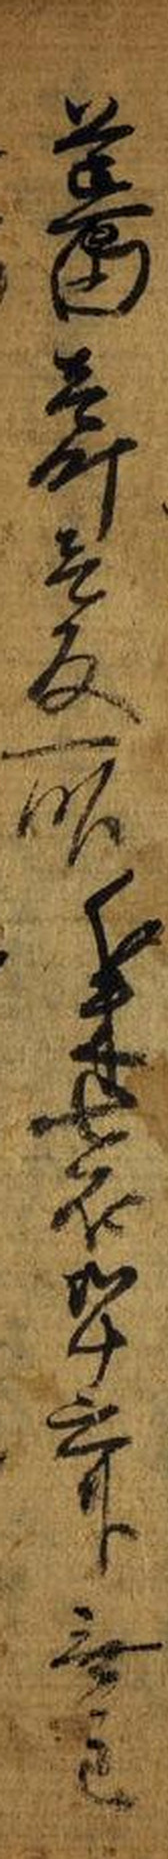荒畠壱町壱反一畝分米七石弐斗六升無主
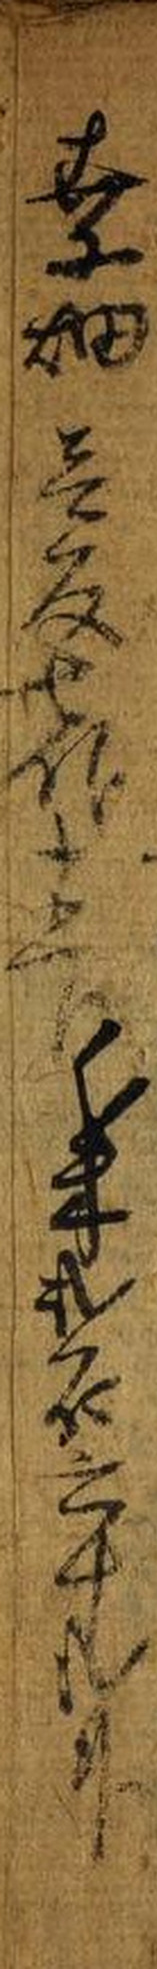桑畑壱反七畝十四分分米弐石六斗弐升
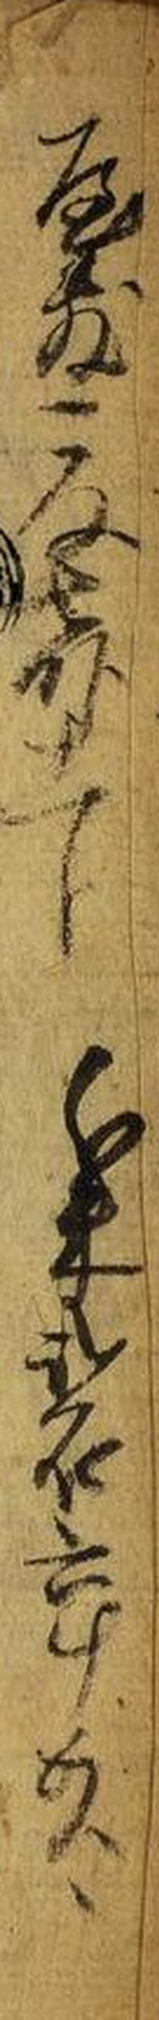屋敷一反七畝十一分分米弐石六斗五合
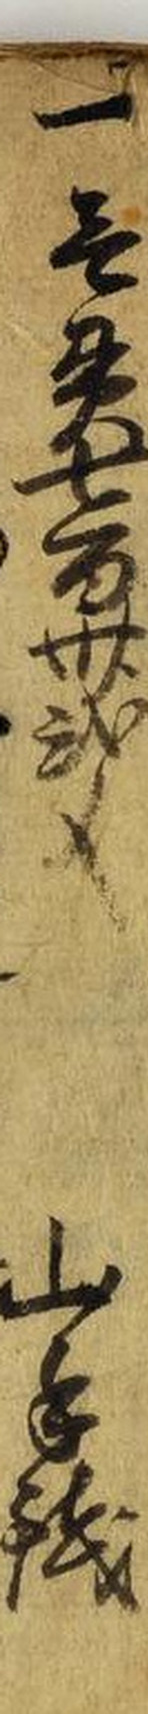一壱貫七百卅弐〆山手銭
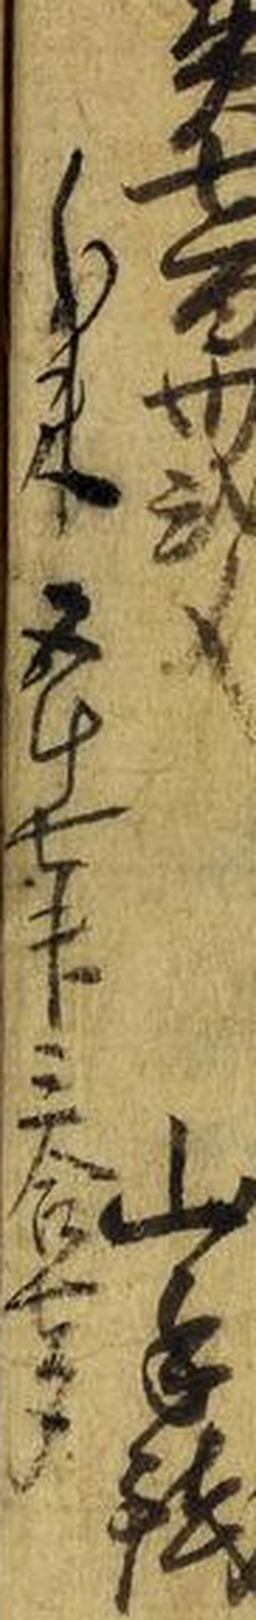分米五斗七升三合七夕
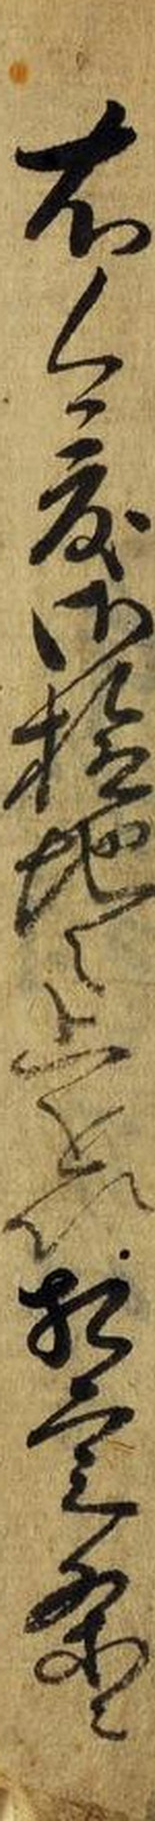右今度御検地之上を以相定条々
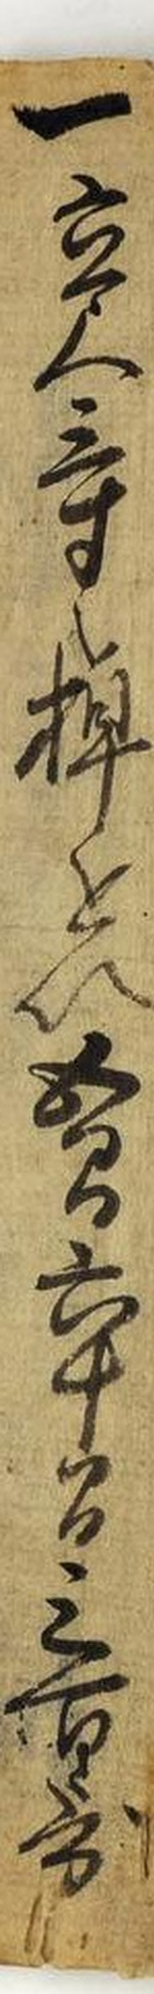一六尺三寸之棹を以五間六拾間三百歩
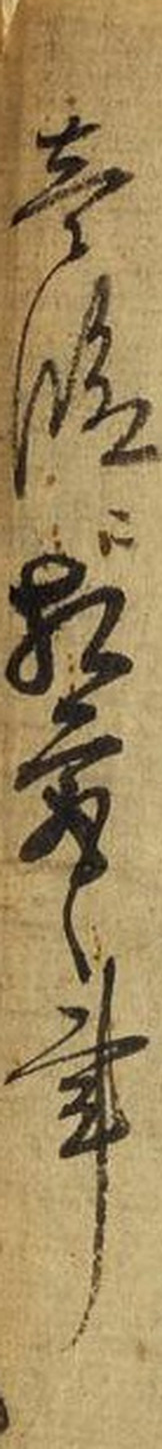壱段二相定候事
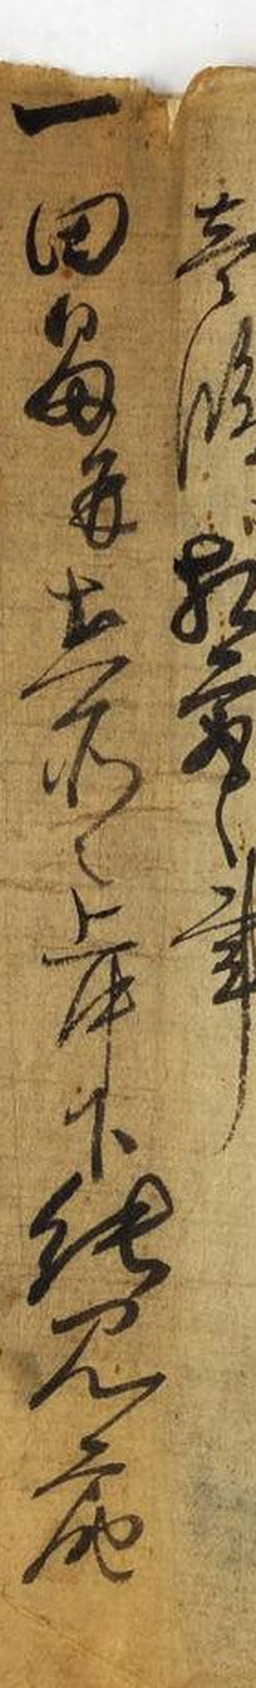一田畠并在所之上中下能見届
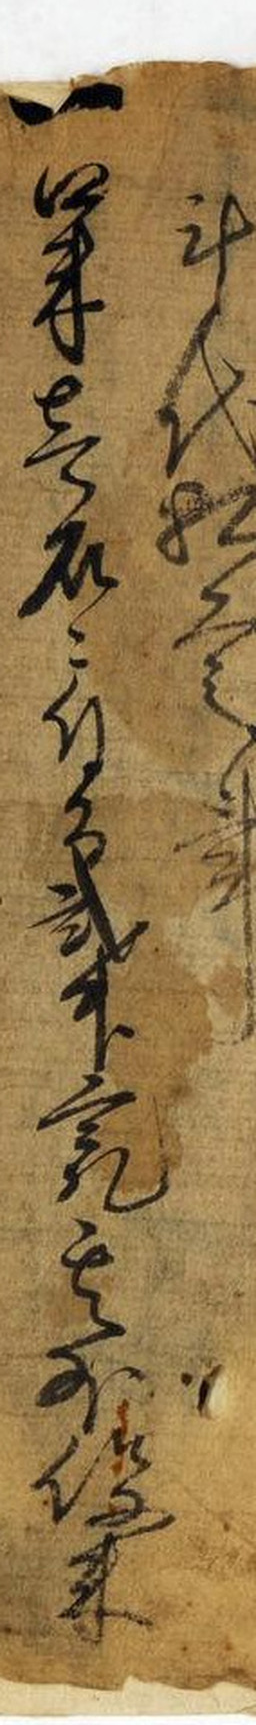一口米壱石二付而弐升宛其外役米

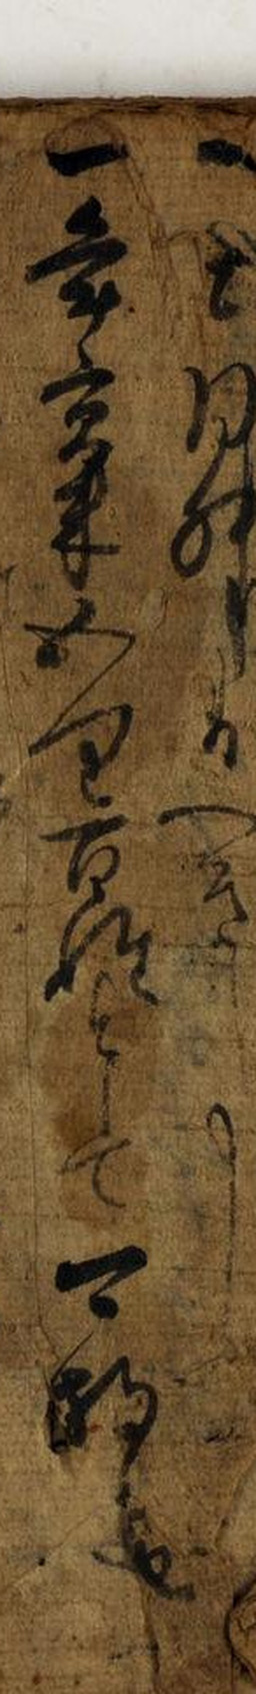一年貢米五里百姓として可持届
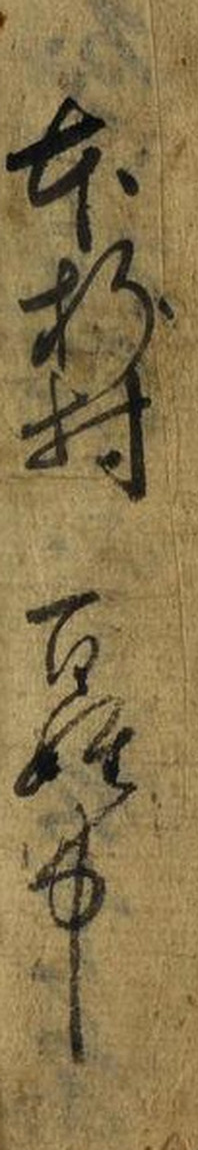東折村百姓中

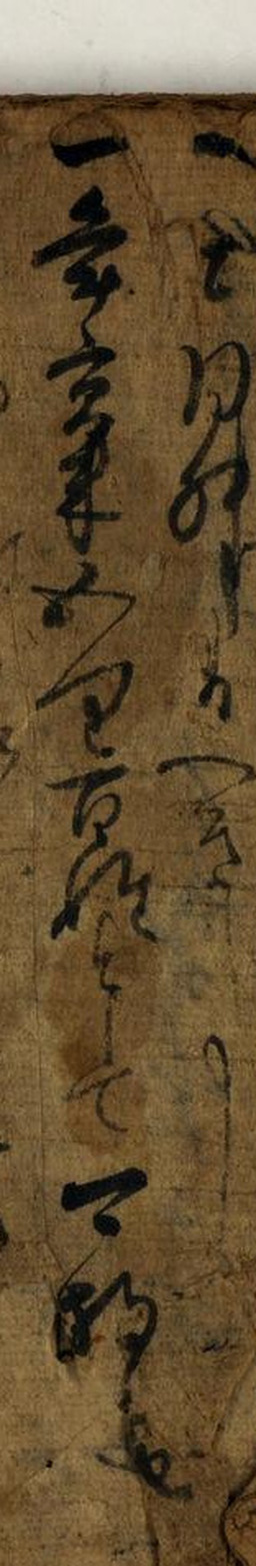一年貢米五里百姓として可持届
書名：越前国西方内志津庄内本折村御検地帳
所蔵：福井県文書館 Fukui Prefectural Archives
